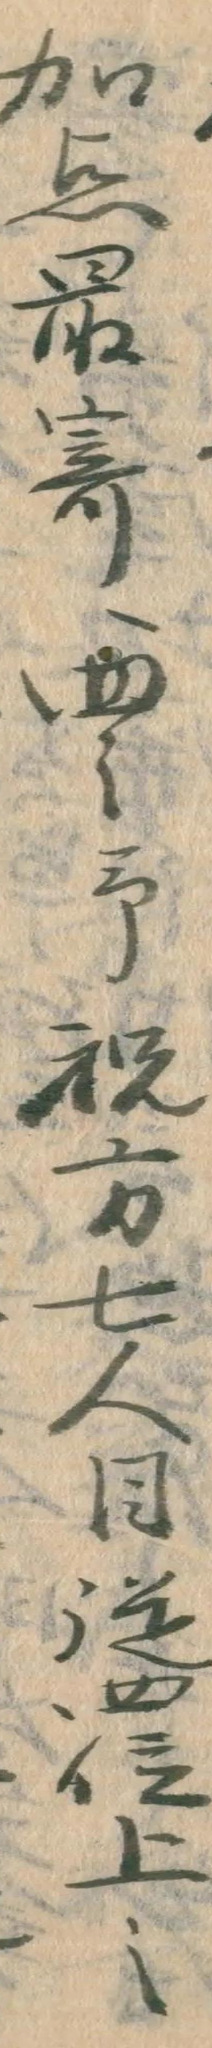加点、最寄へ回之、予祝方七人目従四位上之
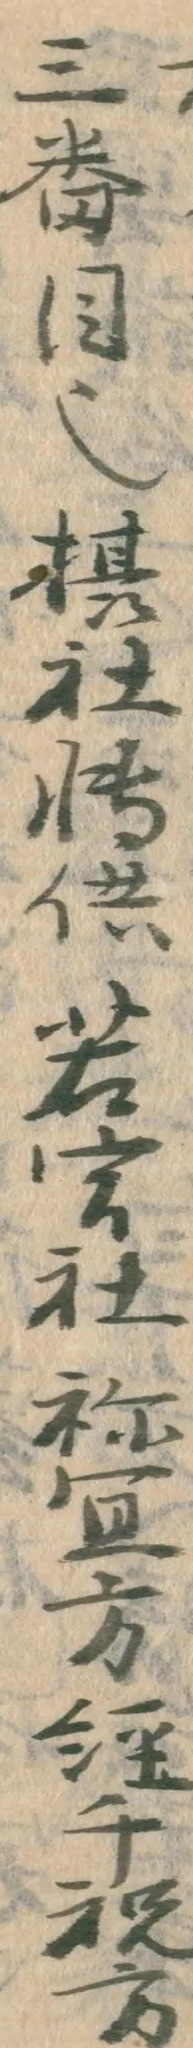三番目也、摂社轉供、若宮社称宜方経千・祝方
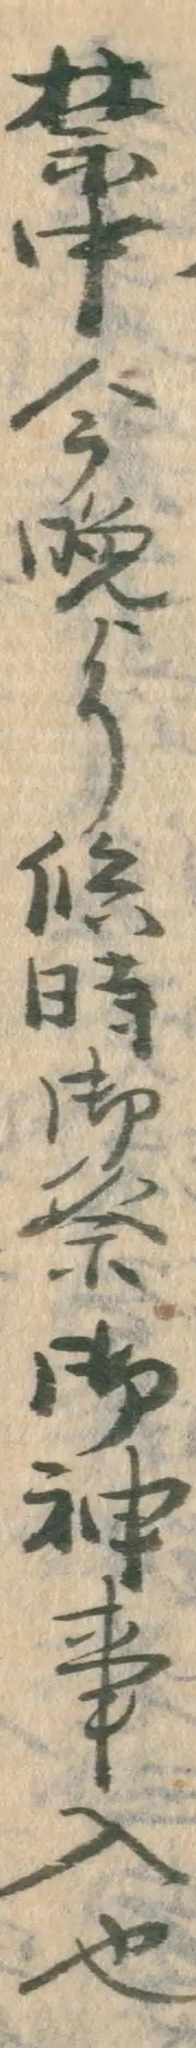禁中今晩より臨時御祭御神事入也、
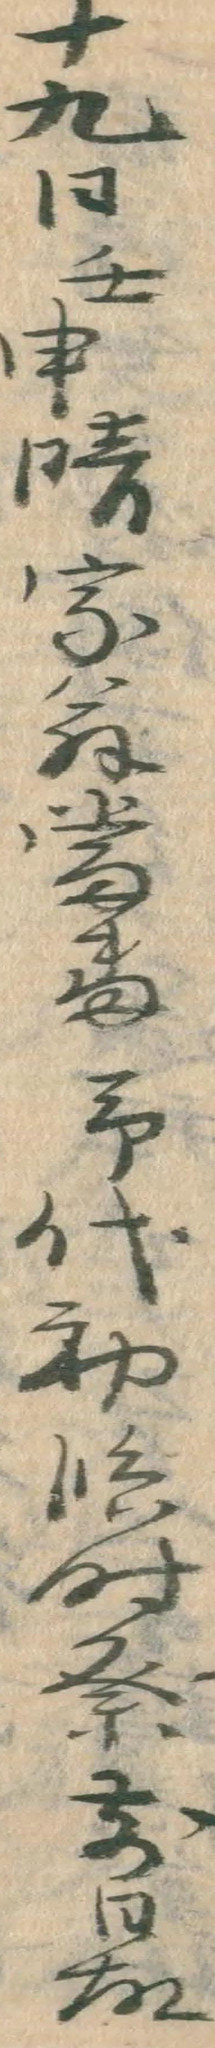十九日壬申晴、家翁當番、予代勤、臨時祭前日故
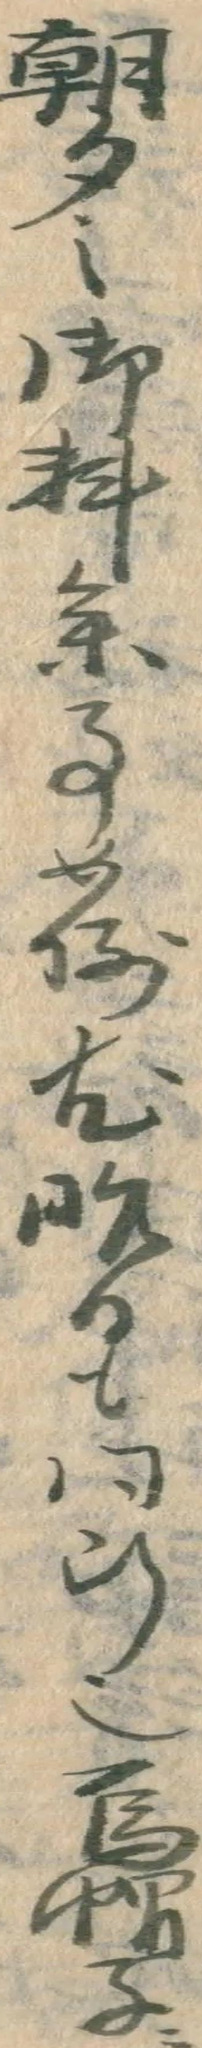朝夕之御料参事如例、尤昨日も同断也、烏帽子ニ
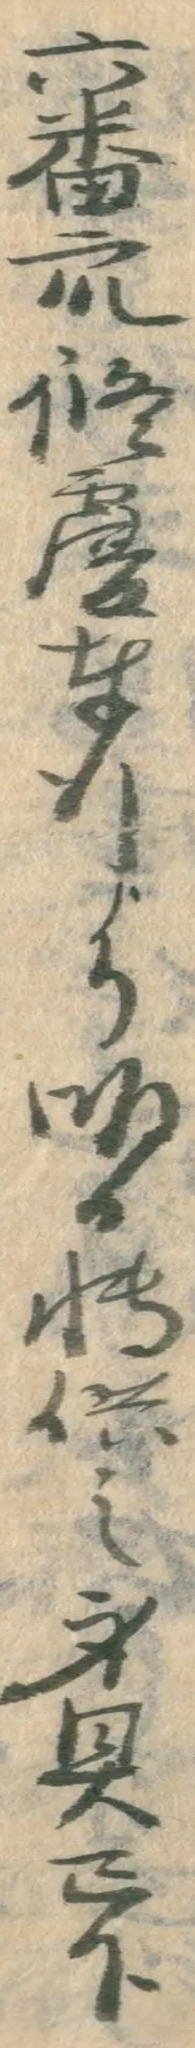六番衆修覆奉行より、明日轉供之身具已下
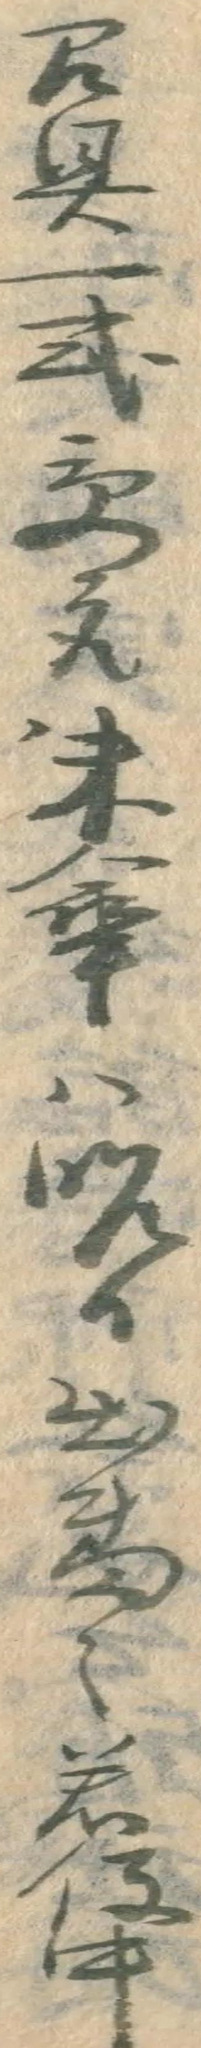召具一式受取、朱傘ハ昨日出番之若役中
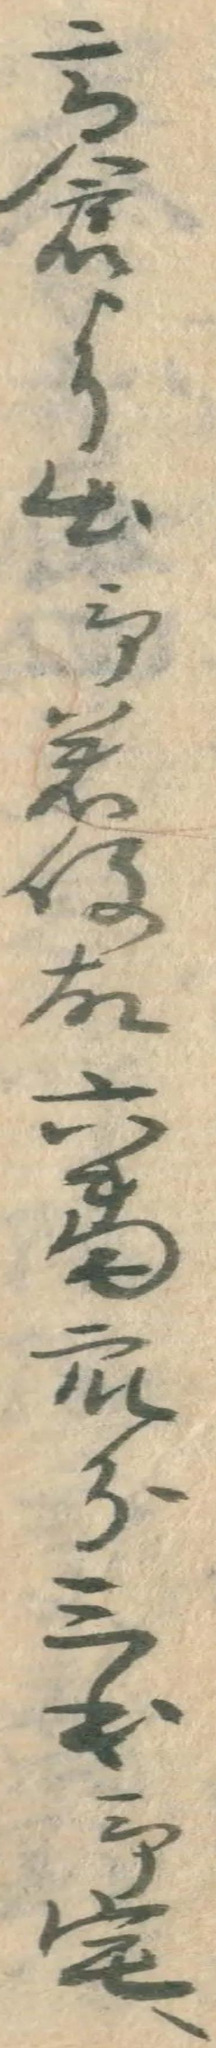高倉より出、予若役故、六番衆分三本、予宅へ

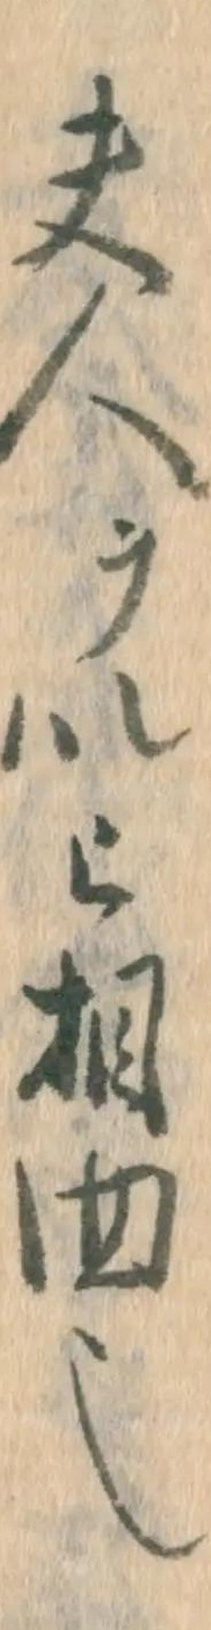夫人ヲ以被相回也、
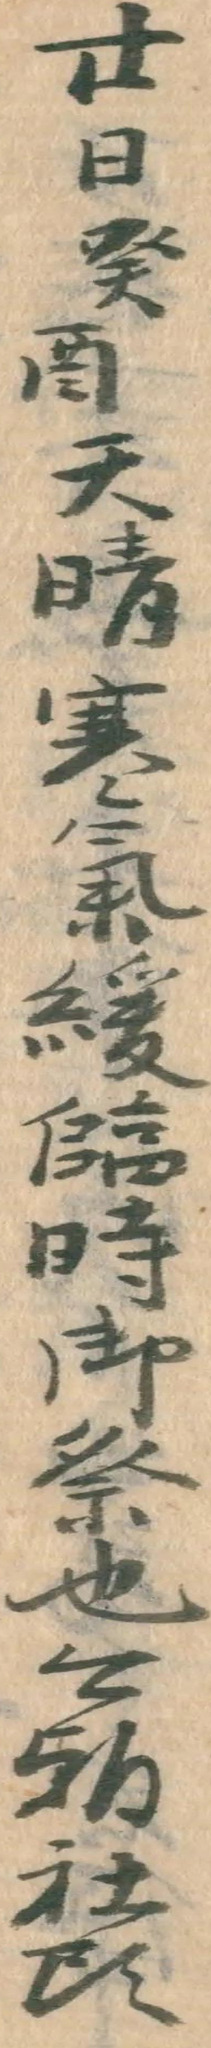廿日癸酉天晴寒気緩、臨時御祭也、今朝社頭
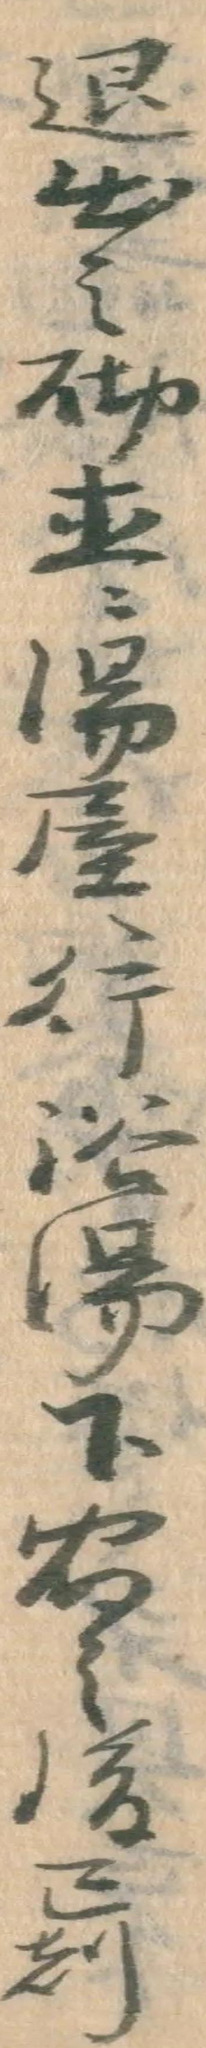退出之砌、直ニ湯屋へ行浴湯、下宿之後、巳刻
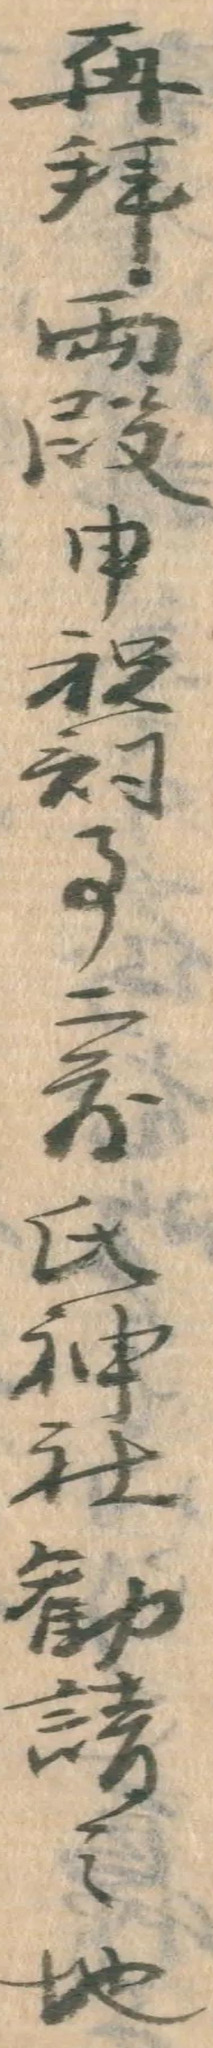再拝両段申祝詞事二度、氏神社勧請之地
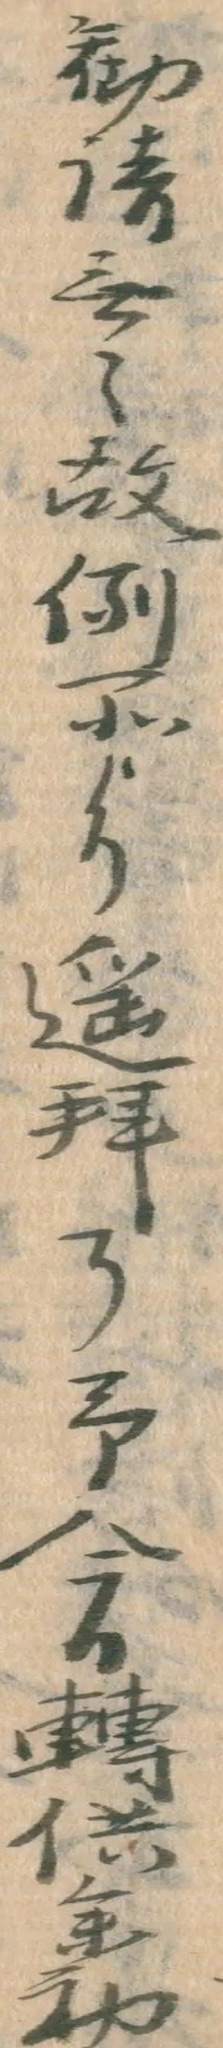勧請無之故、例所より遥拝了、予今日転供参勤、
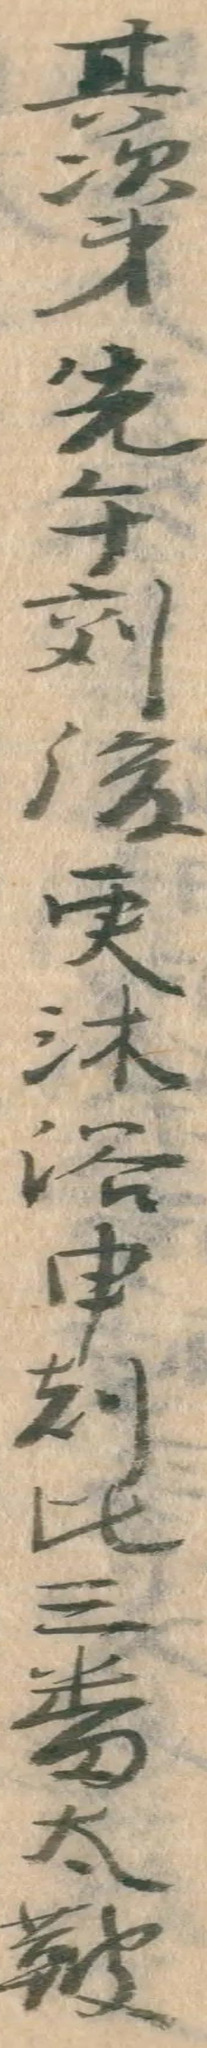其次第、先午刻後更沐浴、申刻比三番太鼓
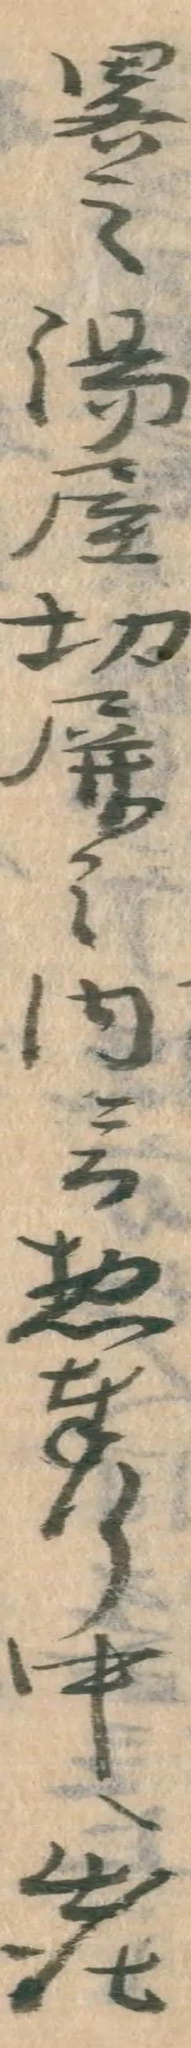略之、湯屋切屏之内ニ而惣奉行中へ出仕
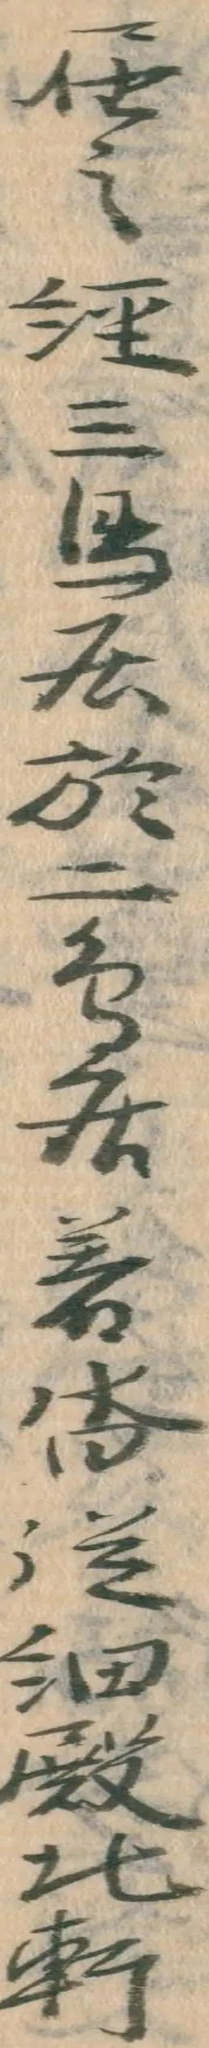届之、経三島居、於二鳥居着沓、従細殿北軒
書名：賀茂社記録. 第63冊
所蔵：国立国会図書館 National Diet Library, JAPAN
